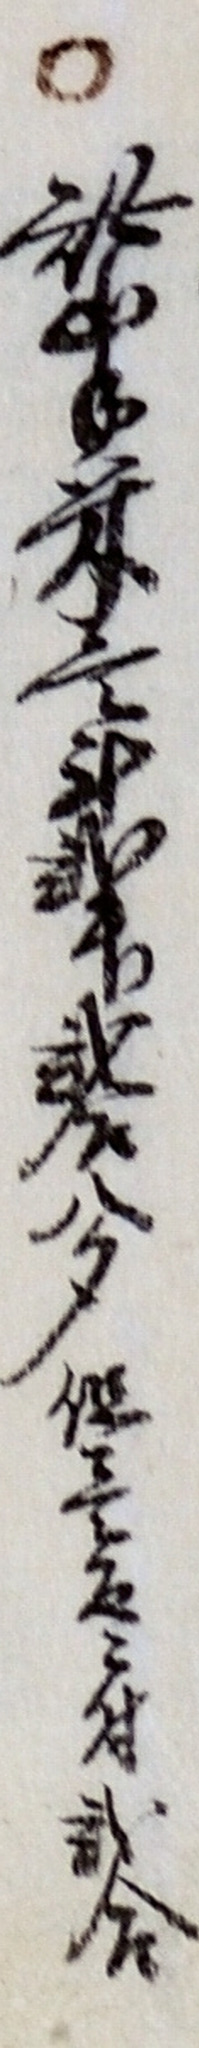〇此山手米壱斗弐升弐合八勺但壱反ニ付弐合
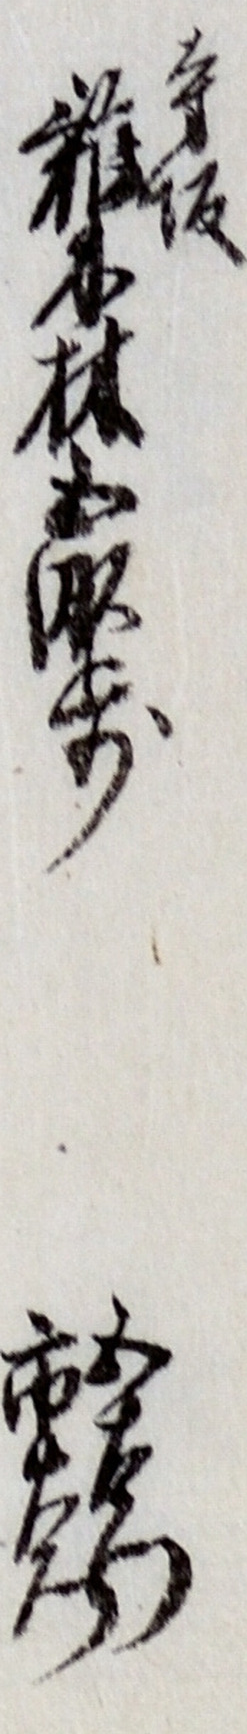雑木林壱畝歩伝右衛門
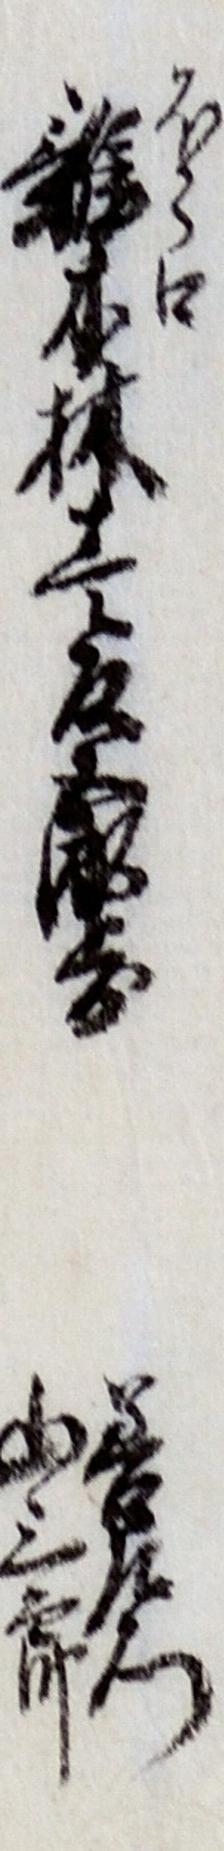芝山壱反五畝歩茂左衛門
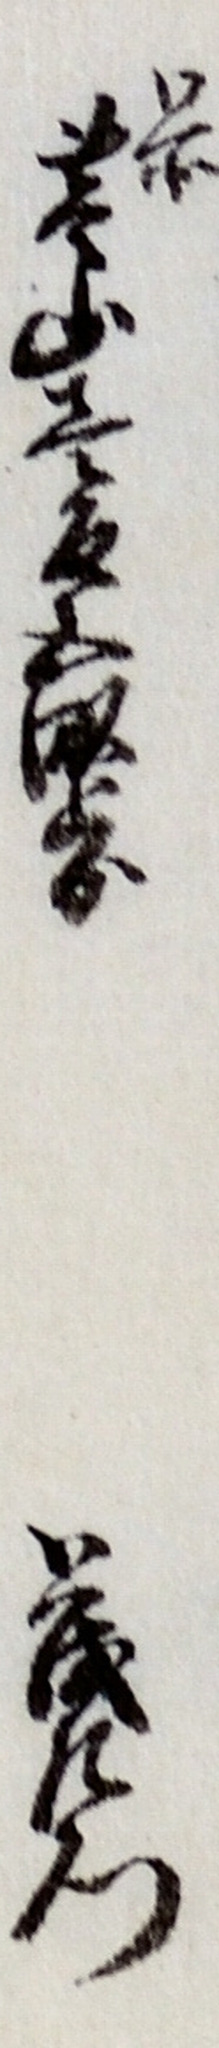芝山壱反五畝歩茂左衛門
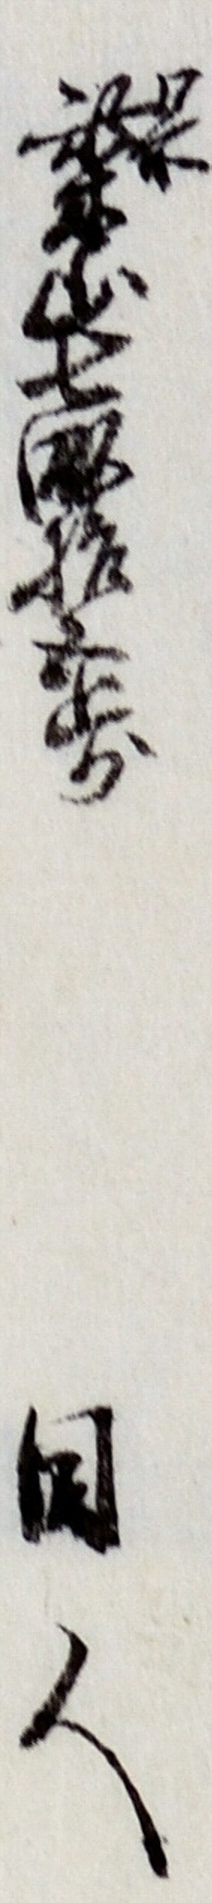柴山七畝拾五歩同人
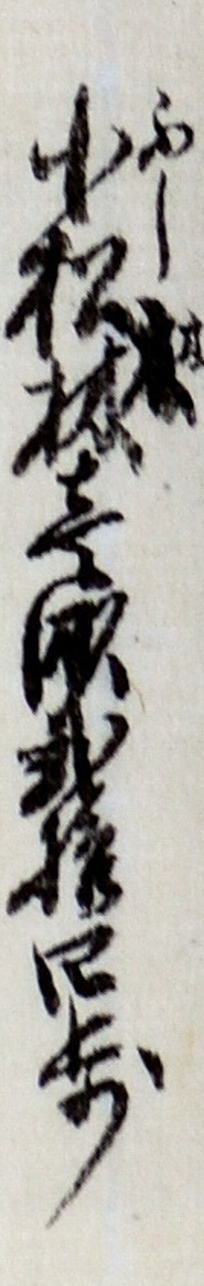小松林壱畝弐拾四歩同人
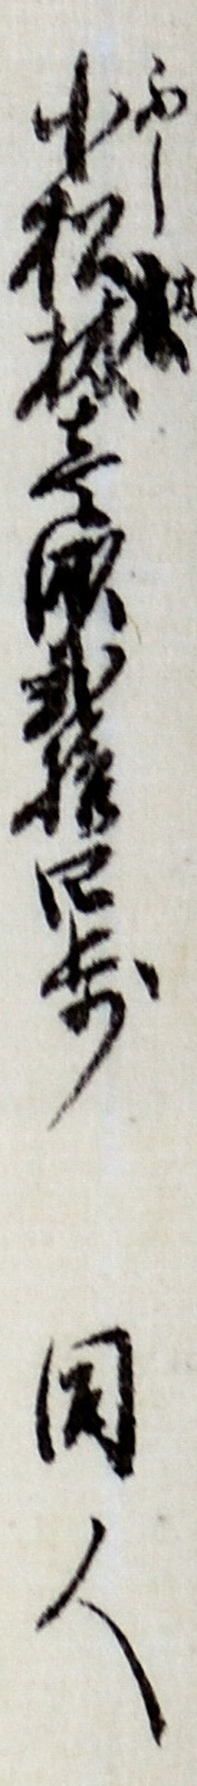小松林壱畝弐拾四歩同人

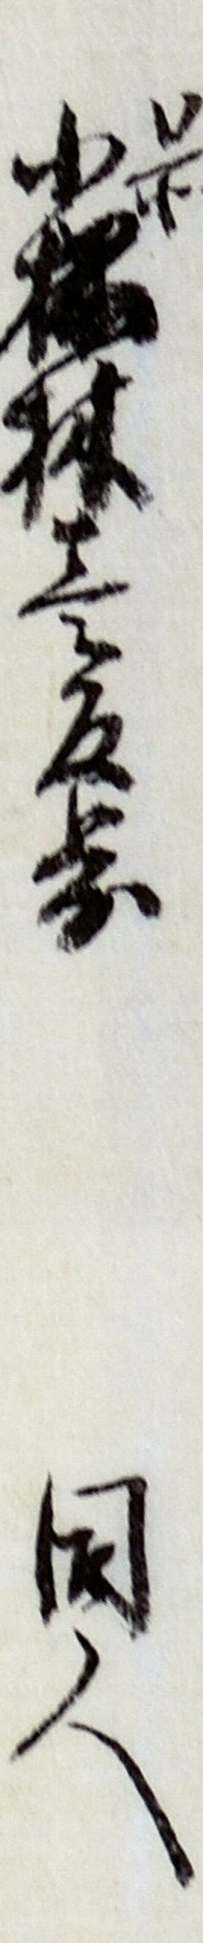小松林壱反歩同人
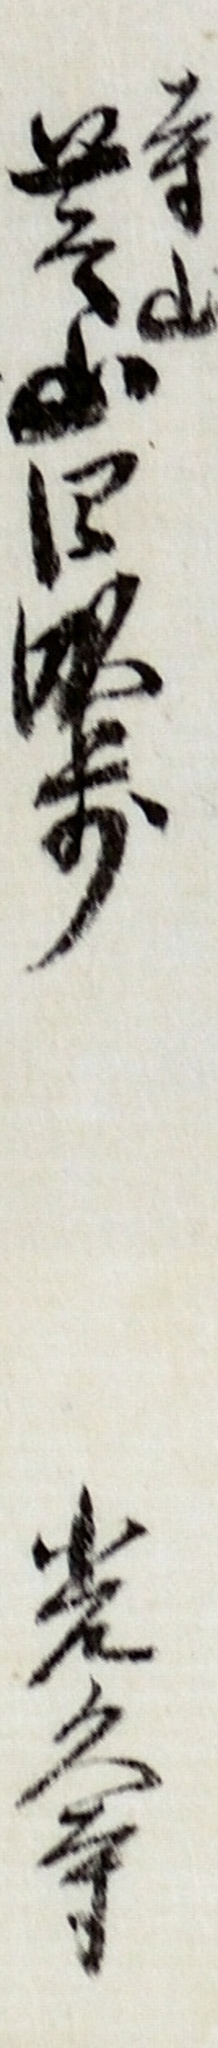芝山四畝歩光久寺
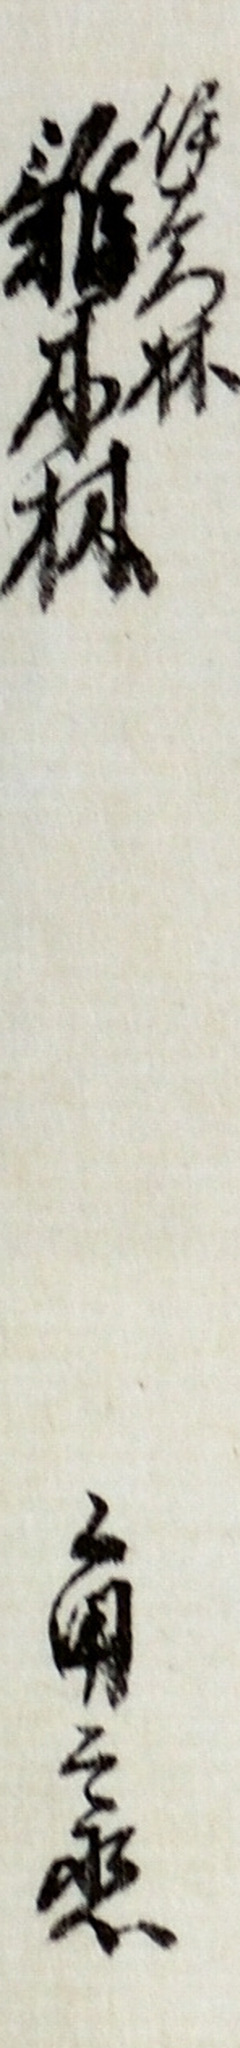雑木林角之烝
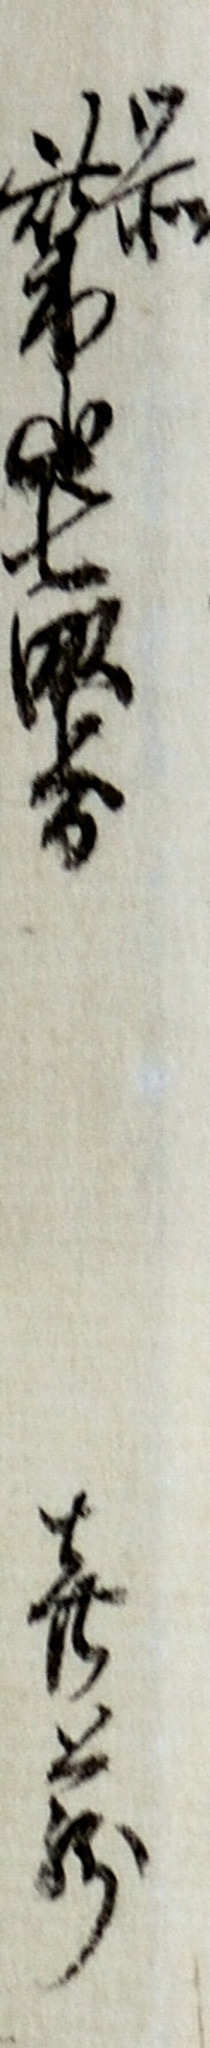柴山七畝歩喜蔵
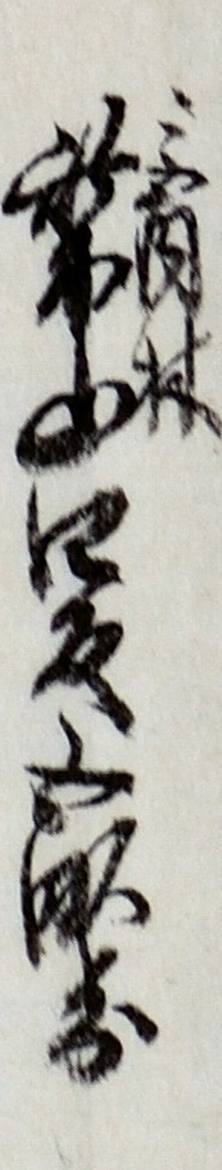柴山四反五畝歩嘉助
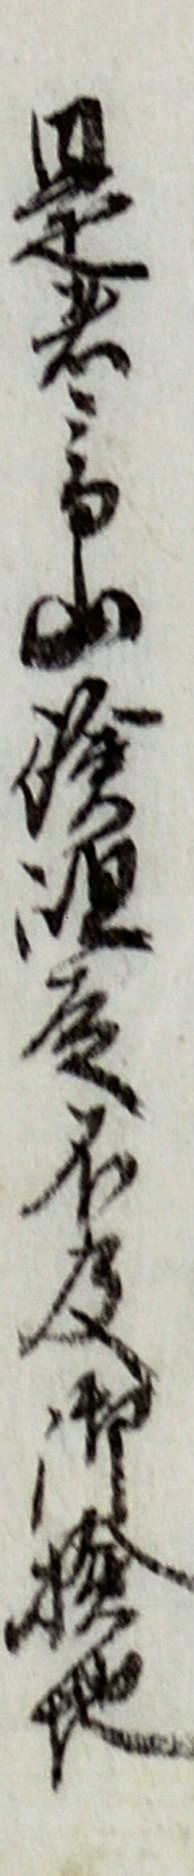是者高山嶮岨故不及御検地
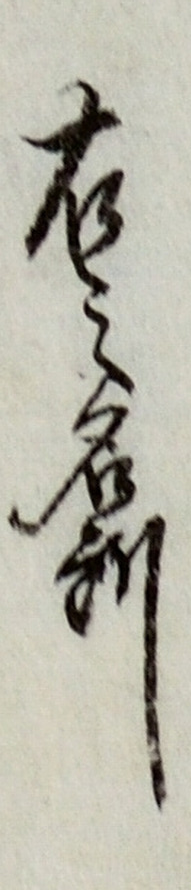右之名所

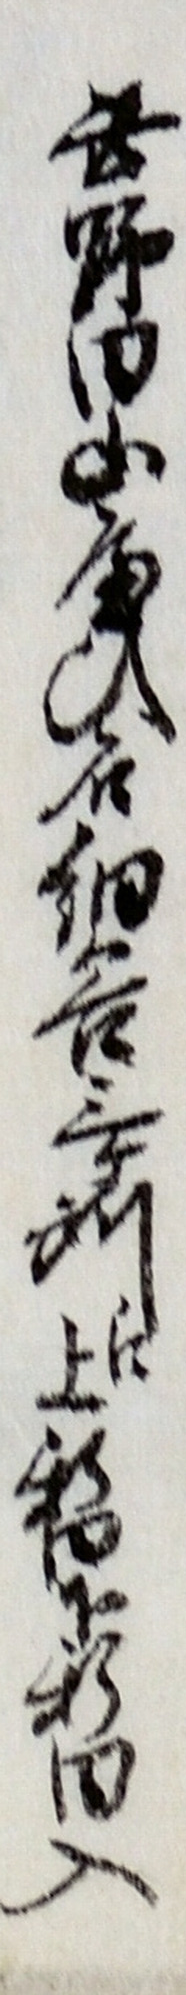此野田山へひ石細谷三ヶ所え上新田下新田入
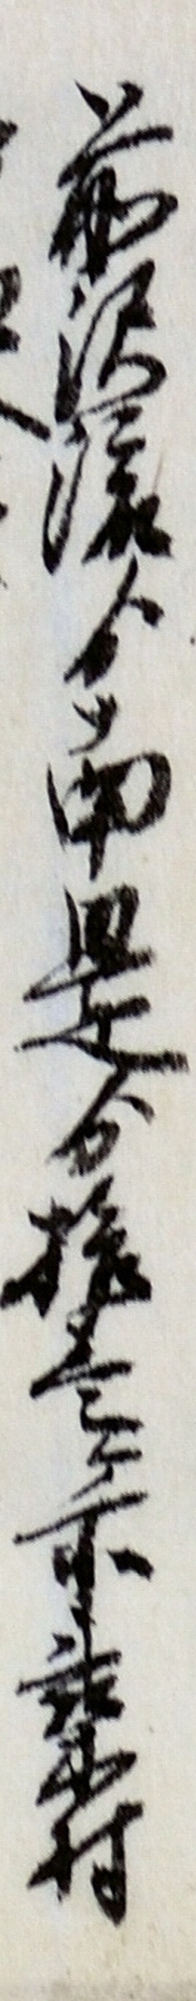前沢流より南是より拾壱ヶ所柴村
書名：御領分中山林社地手控
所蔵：伊那市立高遠町図書館・合同会社AMANE
